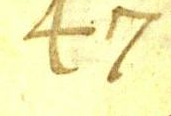47
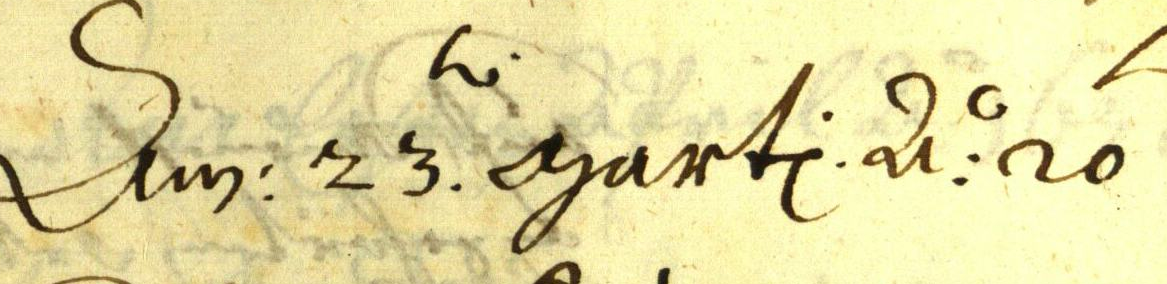Am: 23.t. Marti. Ao: 20t.
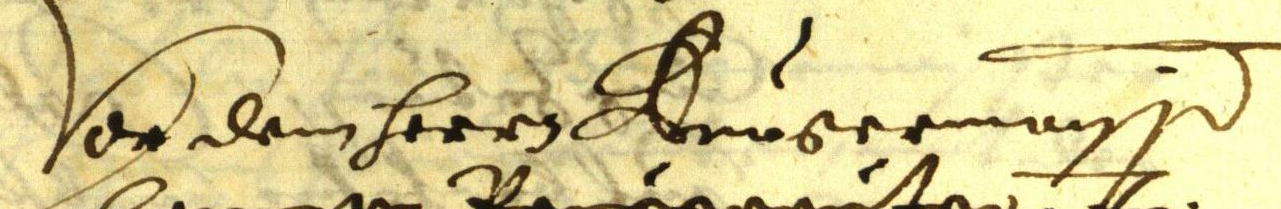Vor dem herrn Būrgermaisst
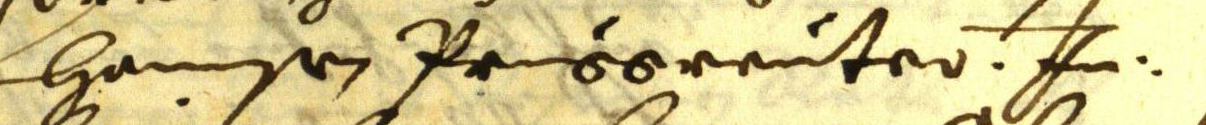Hannsen Prūggreūter. In¬
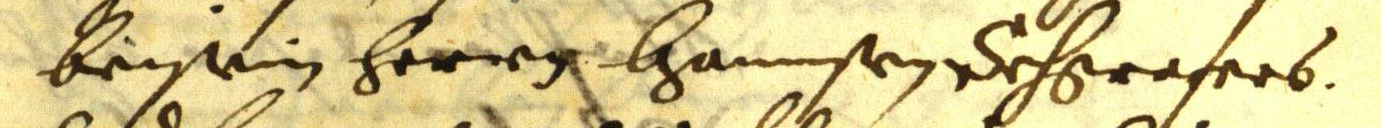beisein herrn Hannsen Schgrafers.
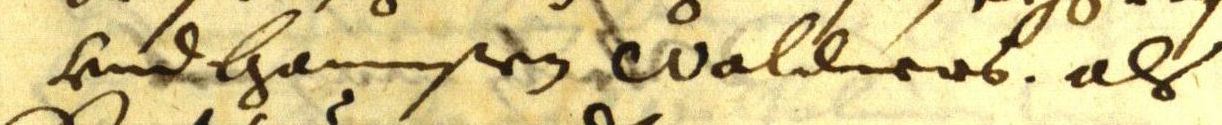vnd Hannsen Waldners. als
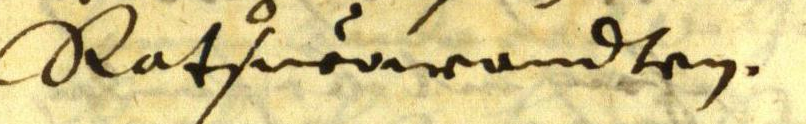Ratsvērwandten.
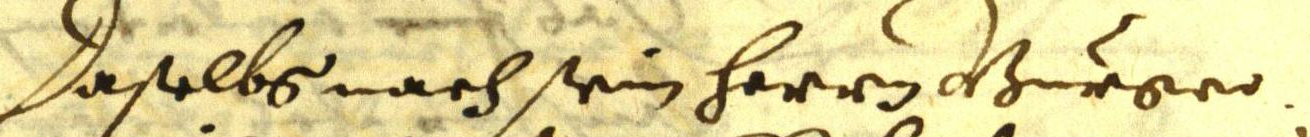Daselbs nach sein herrn Būrger¬
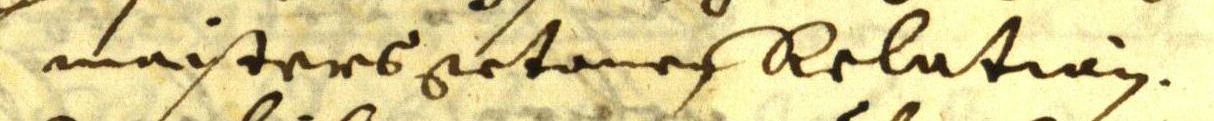maisters getanen Relation.
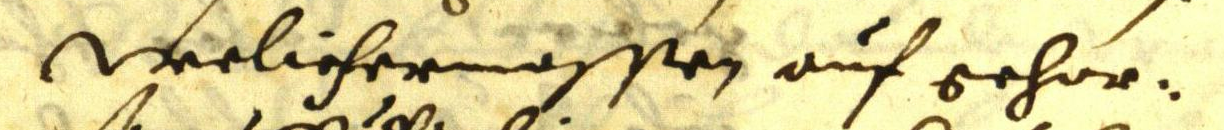Welichermassen aūf gehor¬
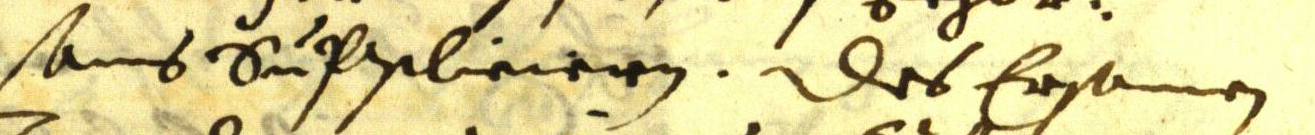sams Sūpplicieren. des Ersamen
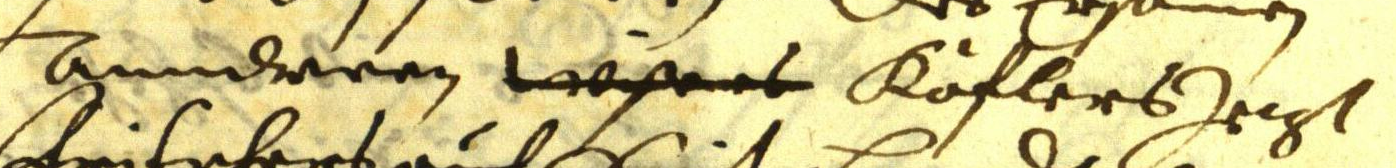Anndreen Wisers Köflers Jetzt
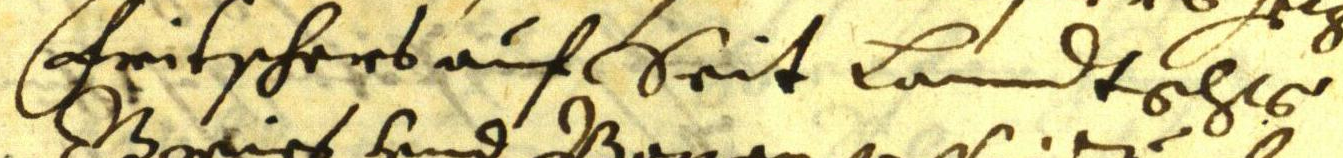Fritschers aūf Seit Lanndtgerichts
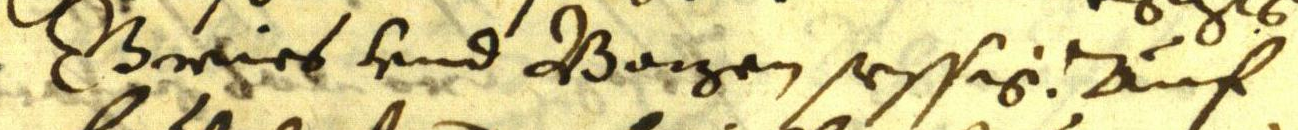Gries vnd Bozen sessig. Aūf
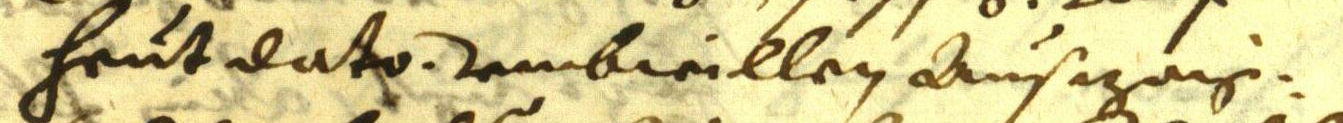heūt dato. vmbwillen aūszaig¬
